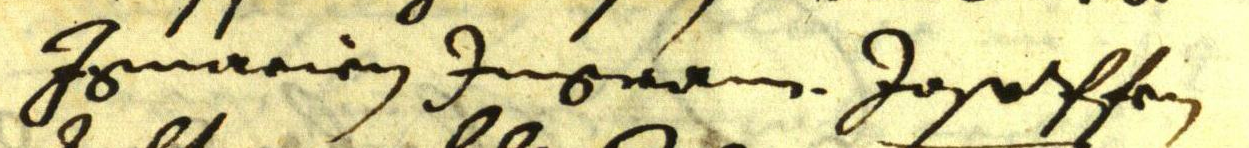Ignacien Ingram. Joseffen
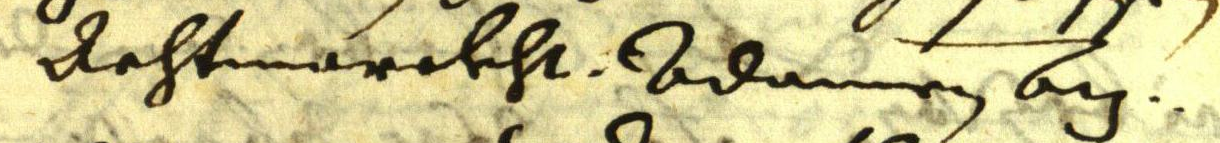Achtmarckht. Adamen Az¬
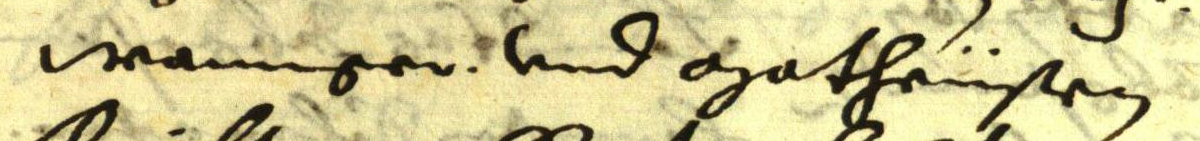wannger. vnd Matheüsen
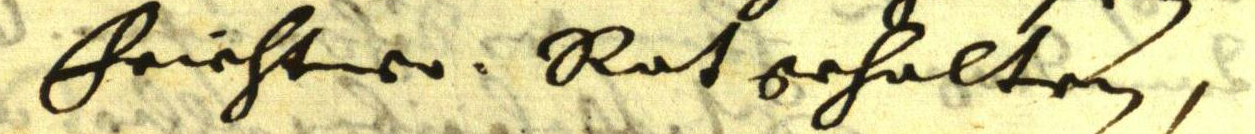Feichtner. Rat gehalten,
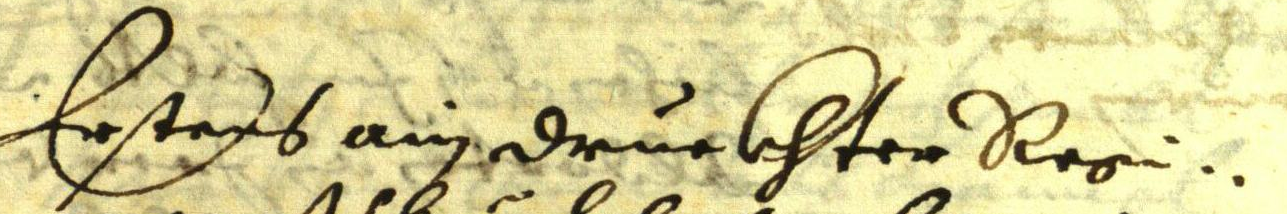Erstens ain drūckhter Regi¬
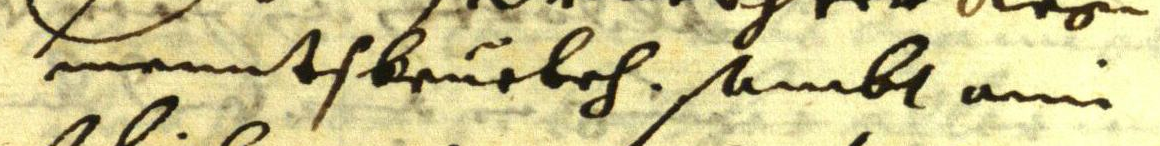menntsbeūelch. sambt ain
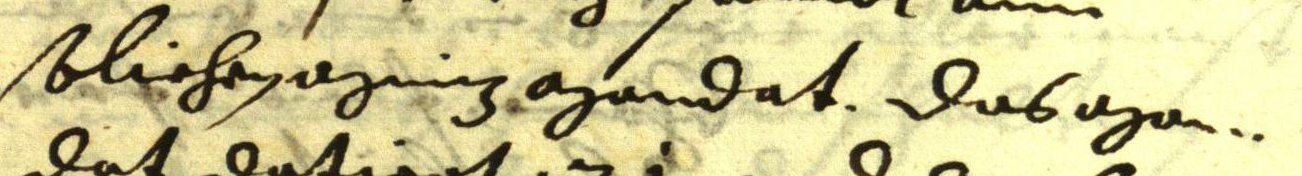solichen Minz Mandat. das Man¬
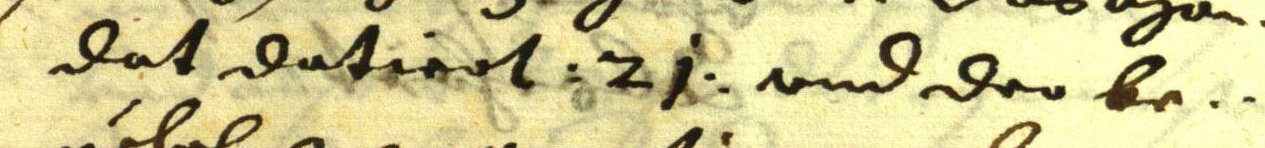dat datiert: 21: vnd der be¬
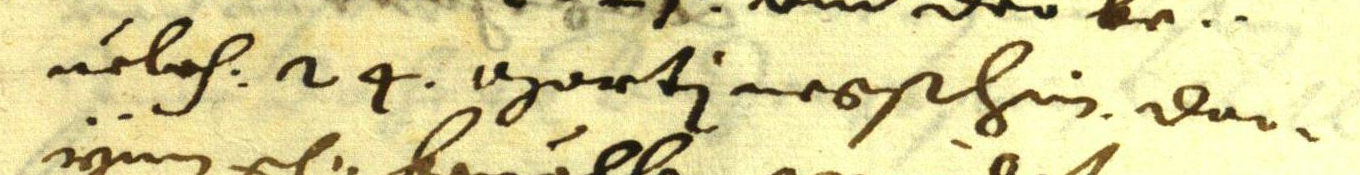ūelch: 24. Martj negsthin. dar¬
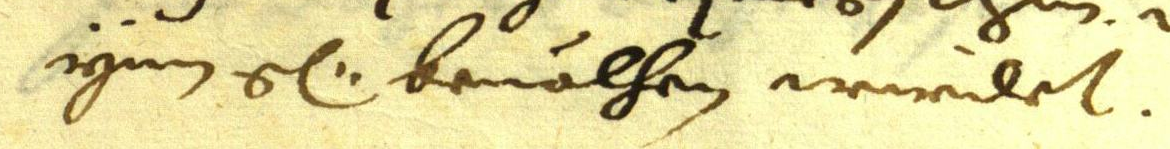ÿnnen g: bevōlhen wirdet.
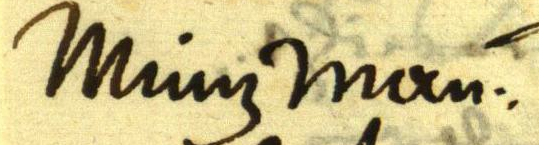Münz Man¬
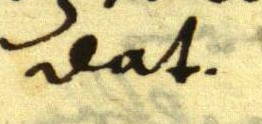dat.
